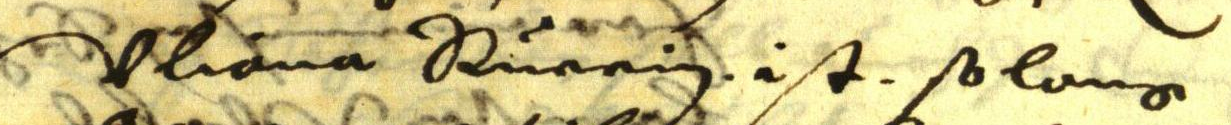Vliana Kūeenin. ist. so lang
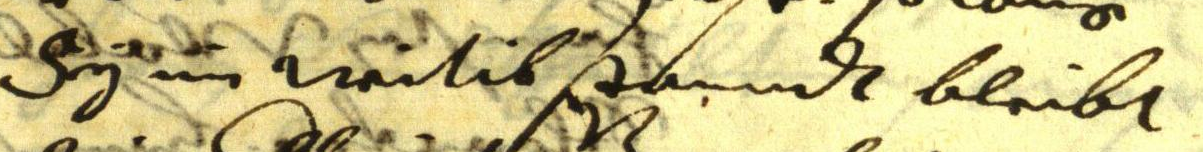Sÿ im Witib stanndt bleibt
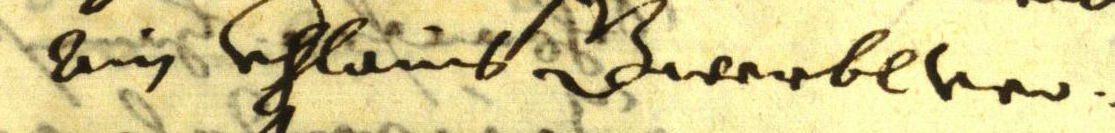Ain khlains Gwerbl ver¬
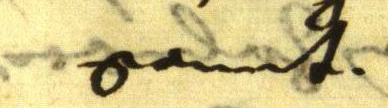gonnt.
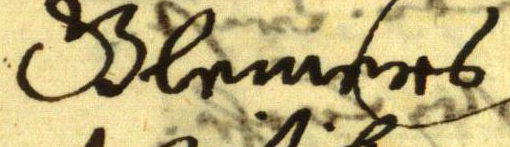Glemers
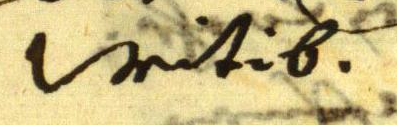Witib.
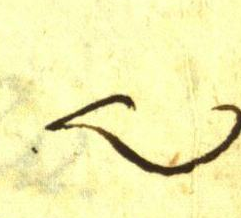t
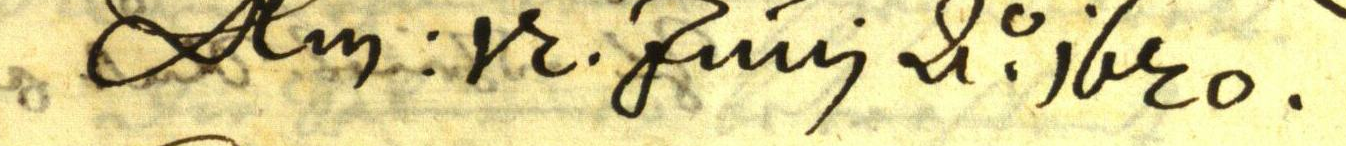Am: 12. Jūnj Ao. 1620.
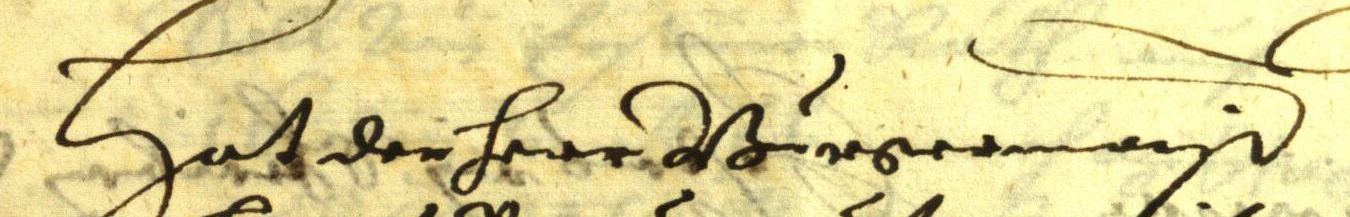Hat der herr Būrgermaist
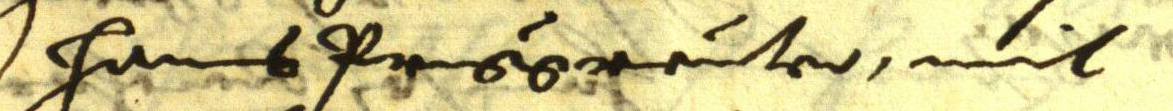hanns Prūggreūter, mit
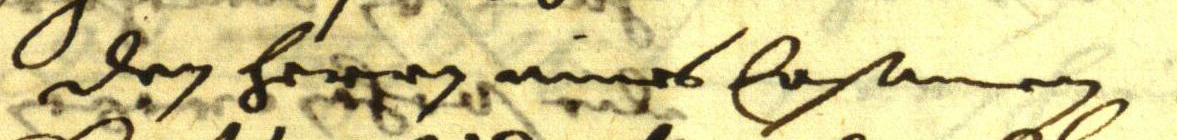den herrn aines Ersamen
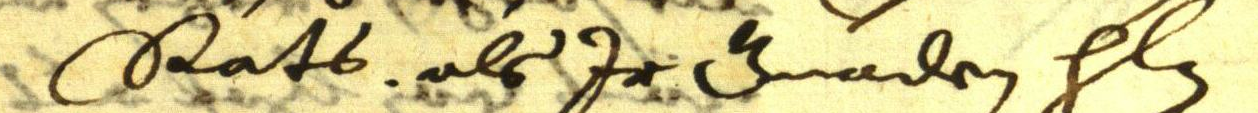Rats. als Ir Gnaden hln
